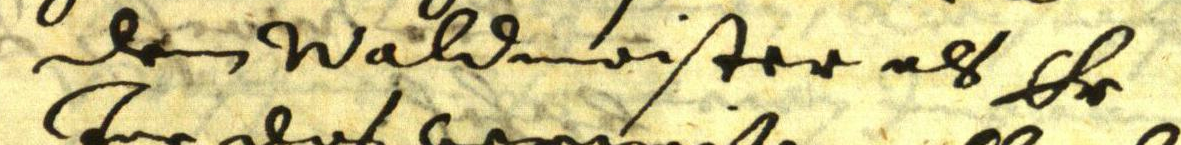dem Waldmaister als Er
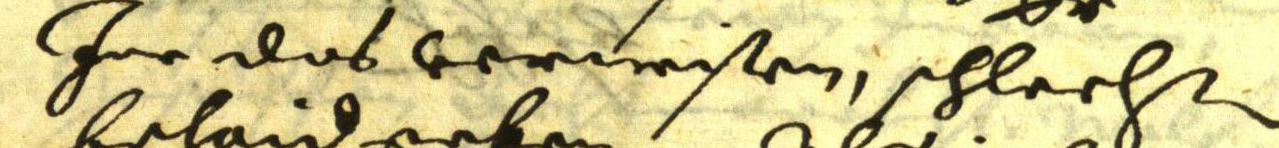Ine das verwisen, schlecht
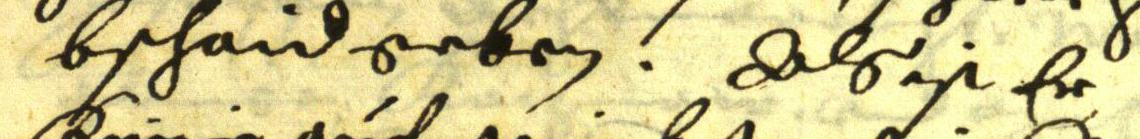bschaid geben. Als ist Er
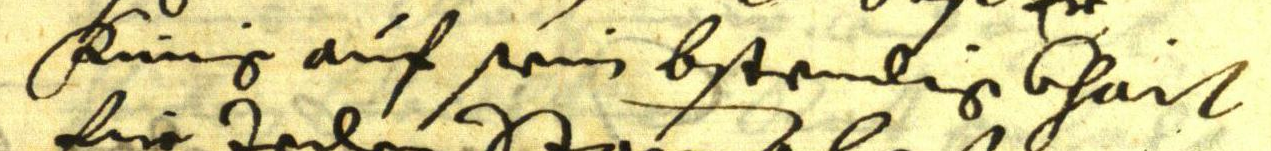Kinig aūf sein bstendig khait
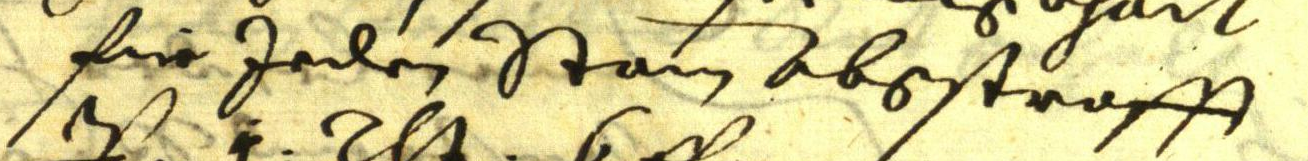fir Jeden Stam Abgstrafft
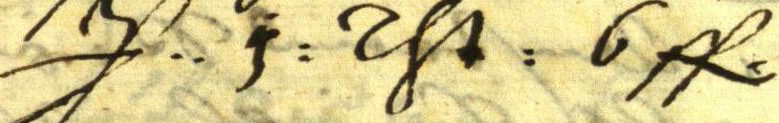P: 1: Tht: 6 fl.
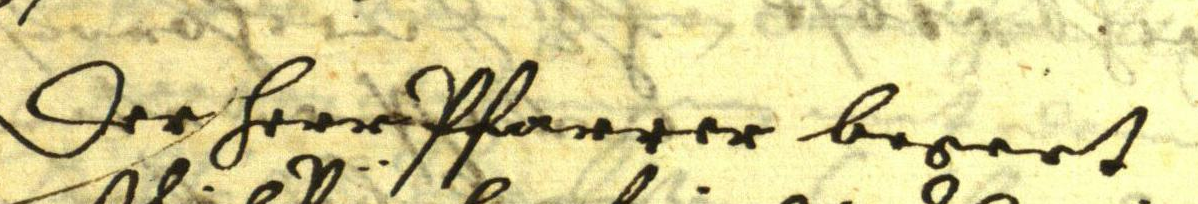Der herr Pfarrer begert
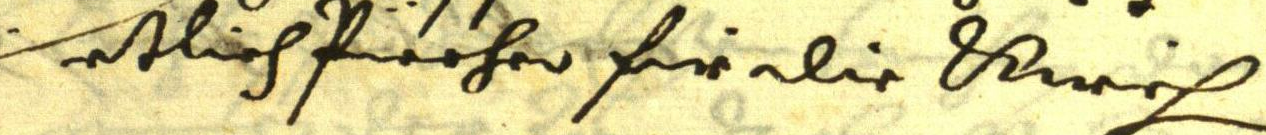etlich Piecher fir die Kirch
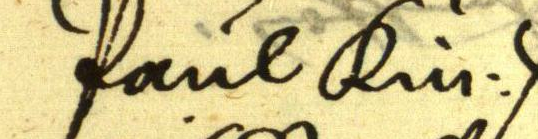Paūl Kin¬
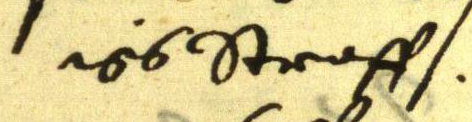igs Straff.
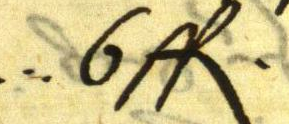—: 6 fl.
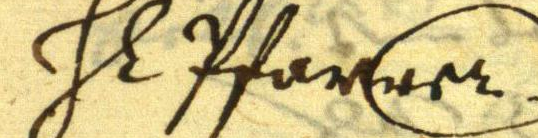h Pfarrer.
